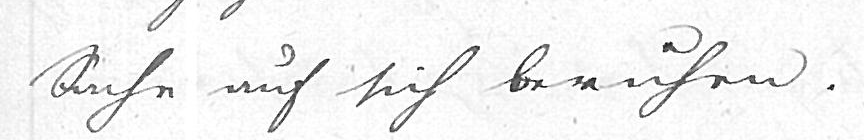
Sache auf sich beruhen.
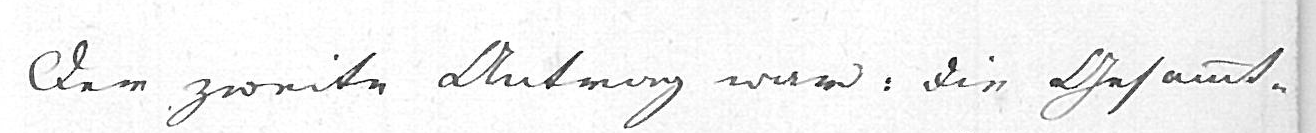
Der zweite Antrag war: die Gesammt-
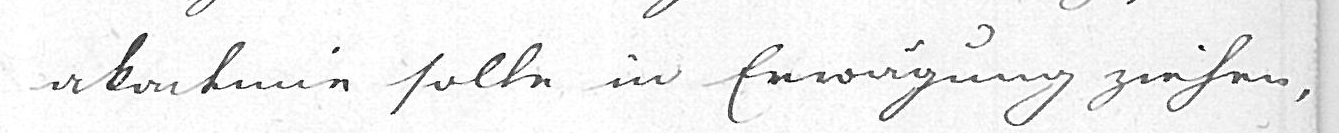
Akademie solle in Erwägung ziehen,
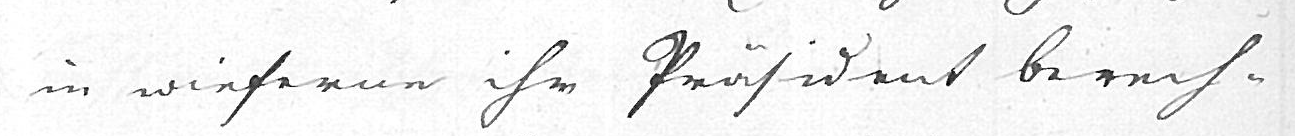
in wieferne ihr Präsident berech-
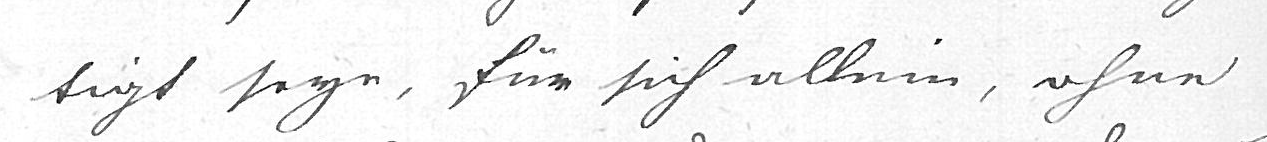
tigt seye, für sich allein, ohne
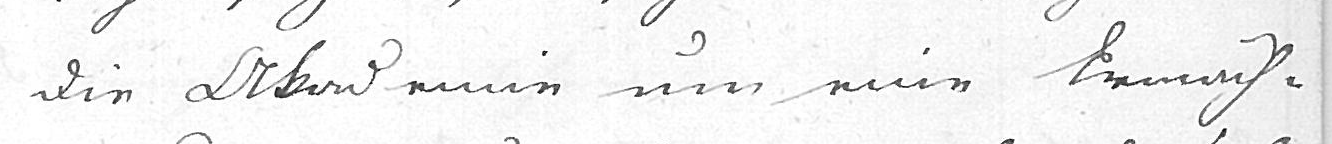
die Akademie um eine Ermäch-
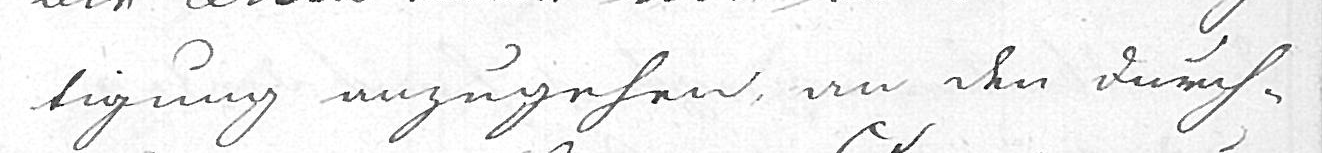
tigung anzusehen, an den Durch-
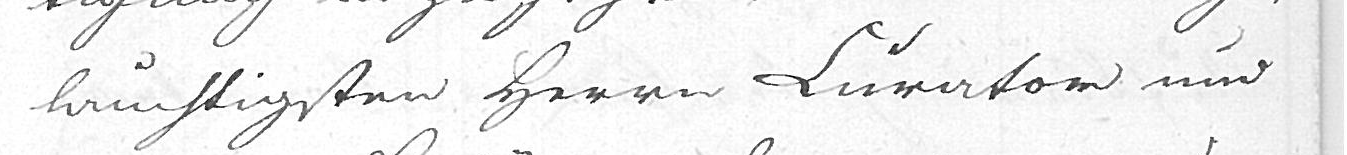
lauchtigsten Herrn Curator und
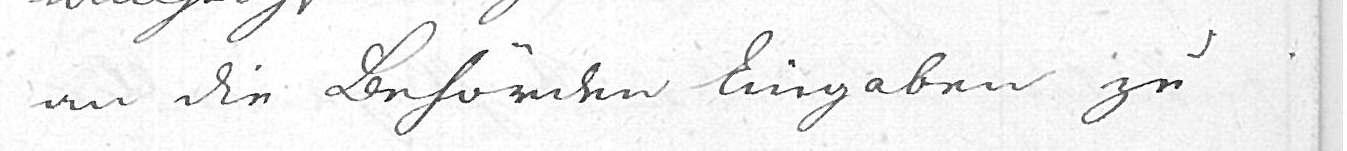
an die Behörden Eingaben zu
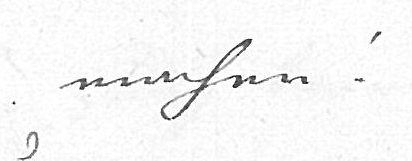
machen.
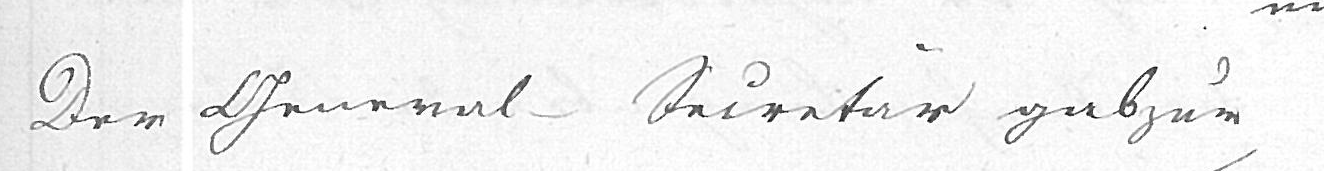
Der General-Secretär gab zur
